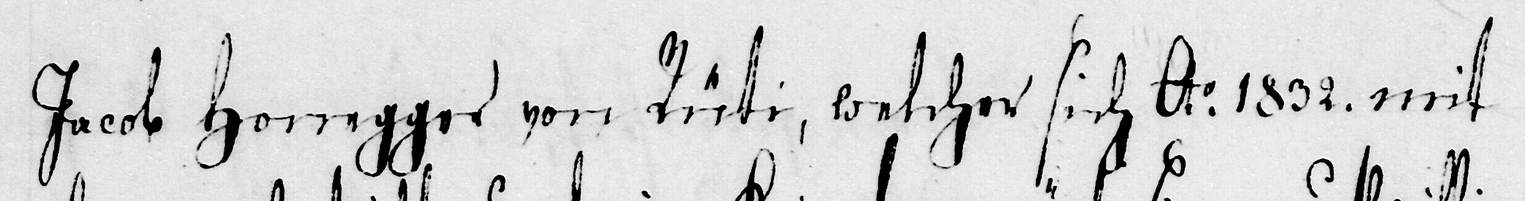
Jacob Honegger von Rüti, welcher sich Ao. 1832. mit
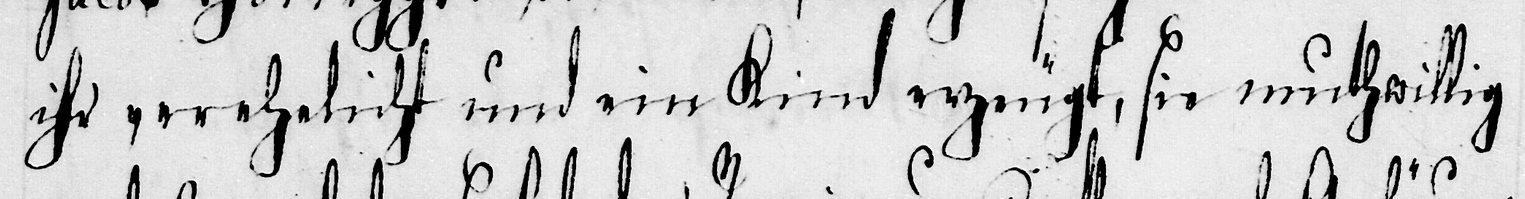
ihr verehelicht und ein Kind erzeugt, sie muthwillig
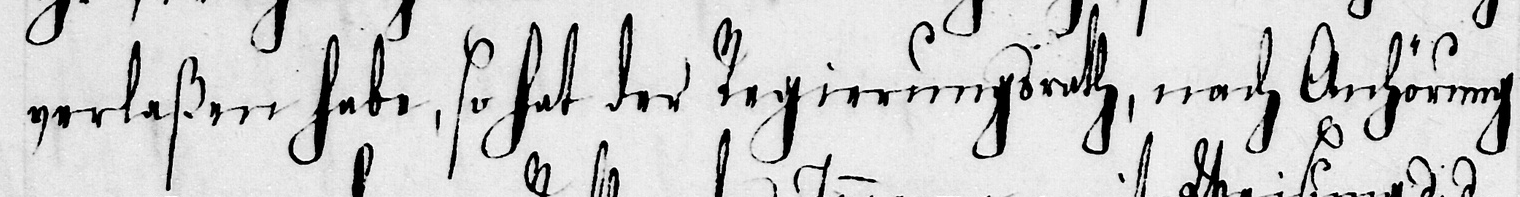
verlaßen habe, so hat der Regierungsrath, nach Anhörung
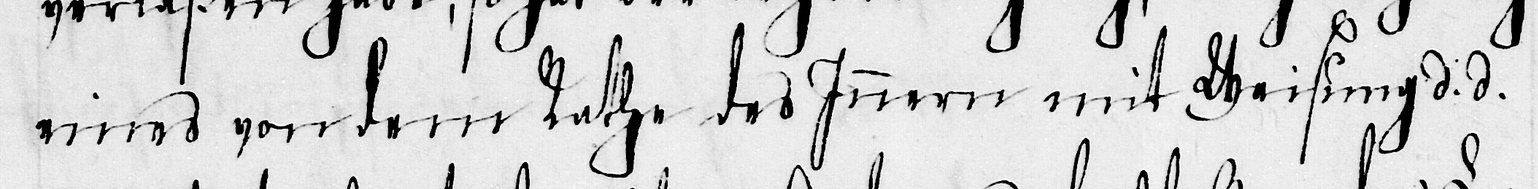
eines von dem Rathe des Innern mit Weisung d. d.
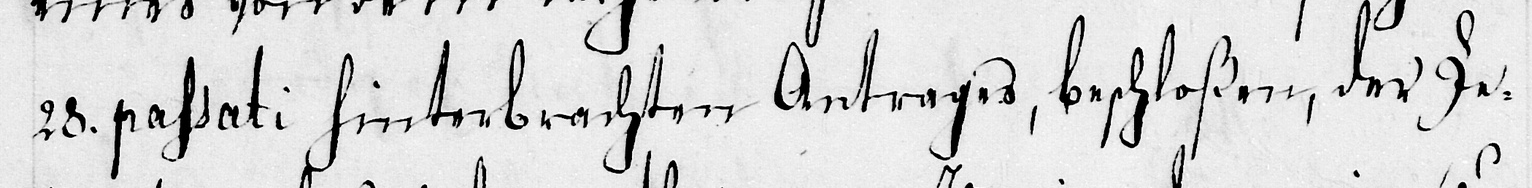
28. passati hinterbrachten Antrages, beschloßen, der Pe¬
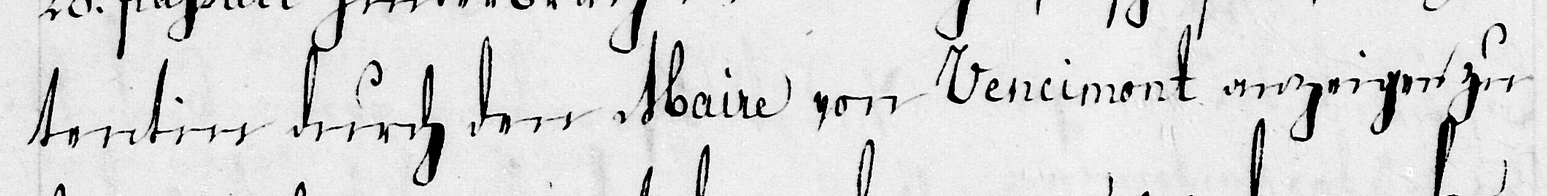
tentin durch den Maire von Vencimont anzeigen zu
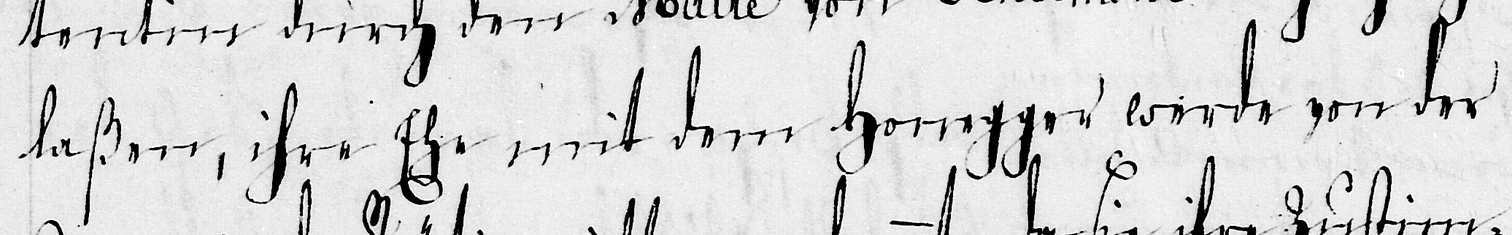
laßen, ihre Ehe mit dem Honegger werde von der
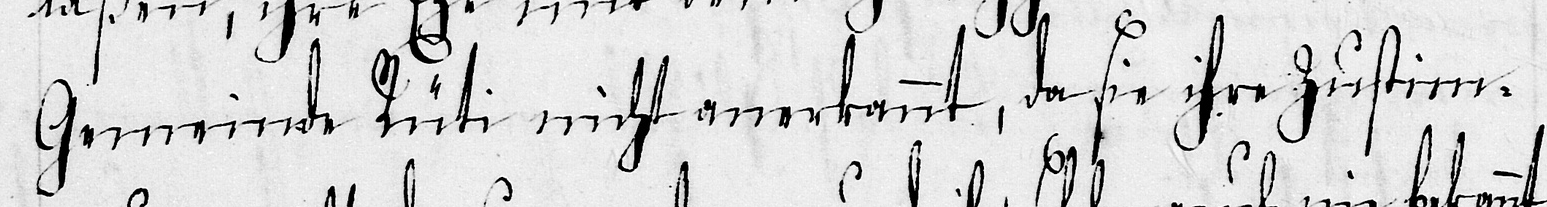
Gemeinde Rüti nicht anerkannt, da sie ihre Zustim¬
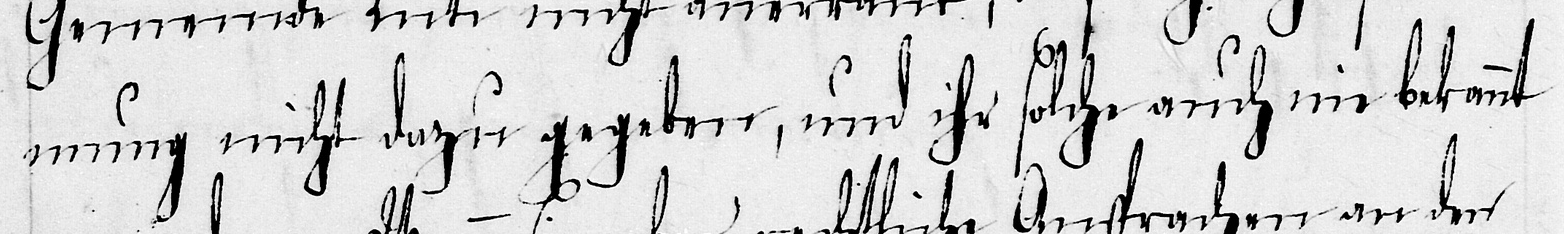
mung nicht dazu gegeben, und ihr solche auch nie bekannt
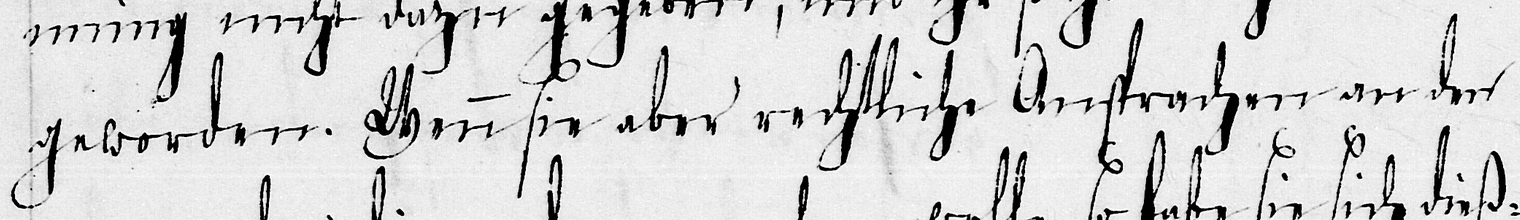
geworden. Wenn sie aber rechtliche Ansprachen an der
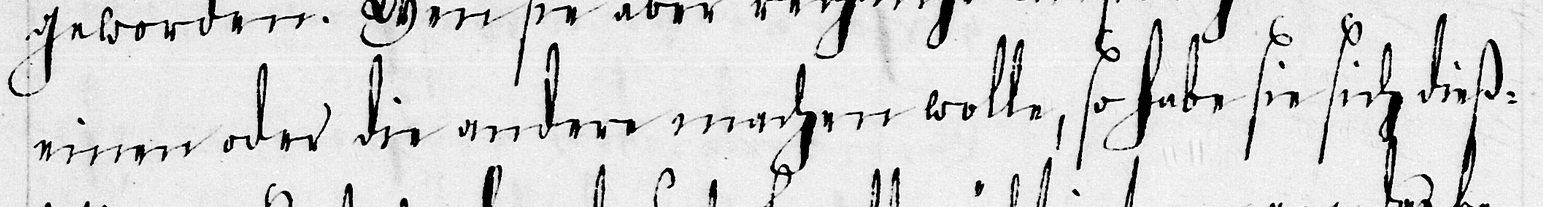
einen oder die andere machen wolle, so habe sie sich
